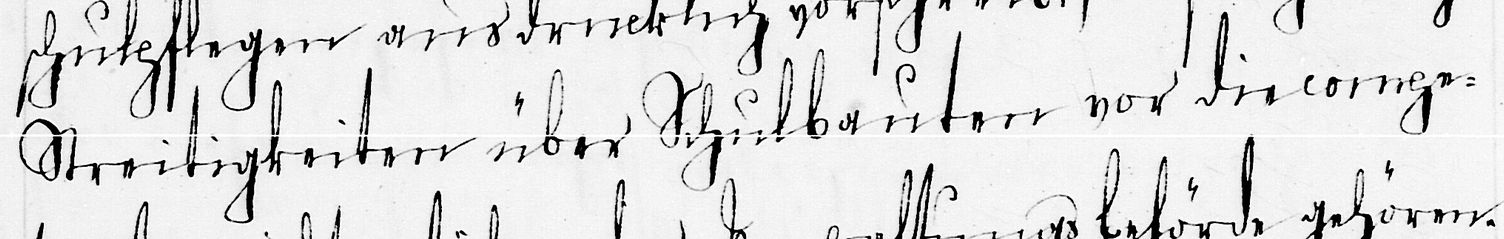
Streitigkeiten über Schulbauten vor die compe¬
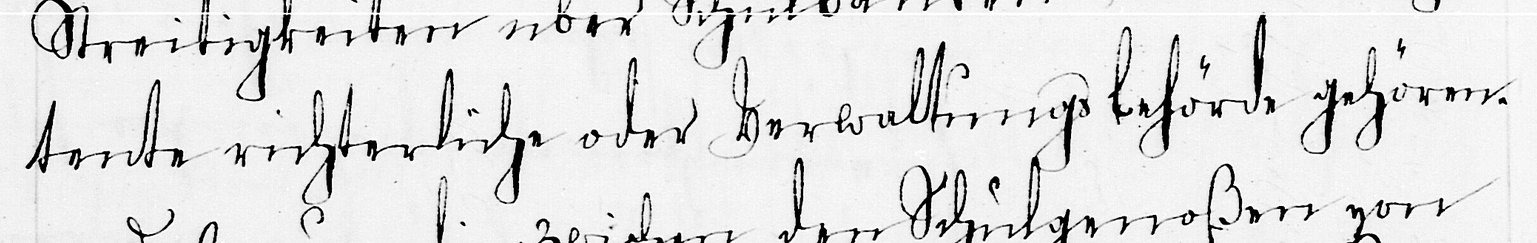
tente richterliche oder Verwaltungsbehörde gehören.
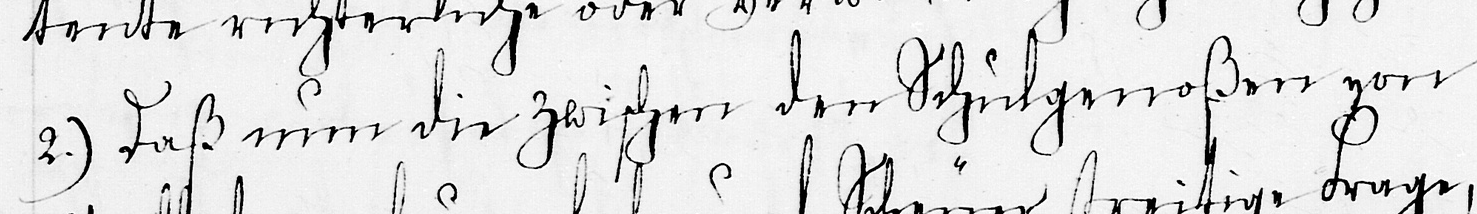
2.) Daß nun die zwischen den Schulgenoßen von
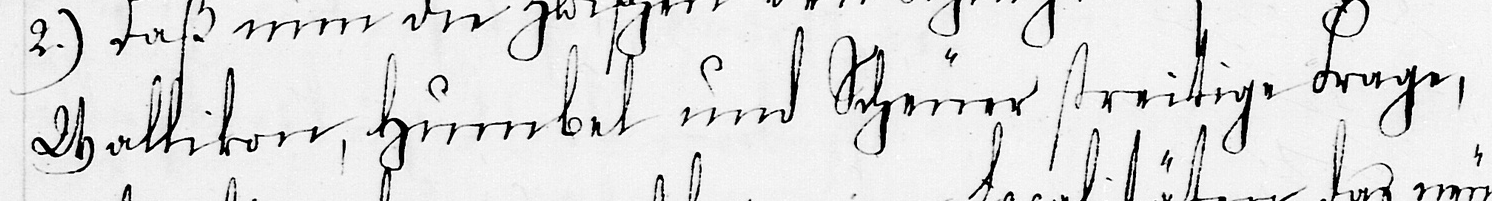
Wallikon, Humbel und Scheuer streitige Frage,
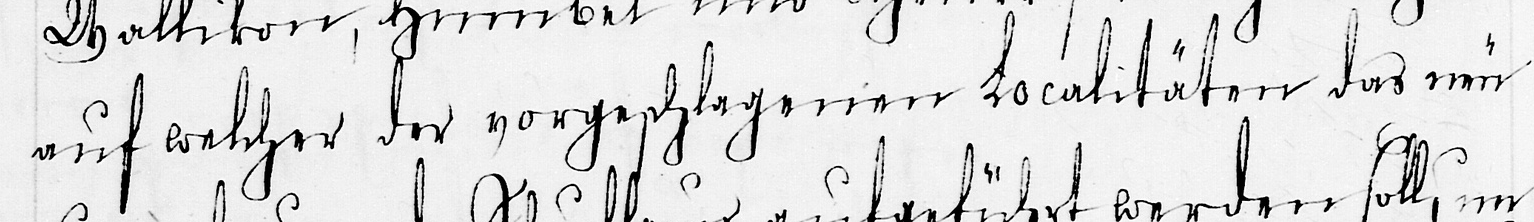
auf welcher der vorgeschlagenen Localitäten das neu
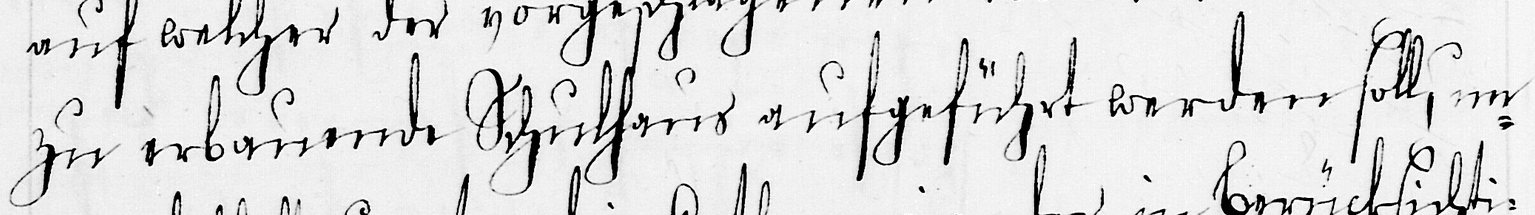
zu erbauende Schulhaus aufgeführt werden soll, u¬
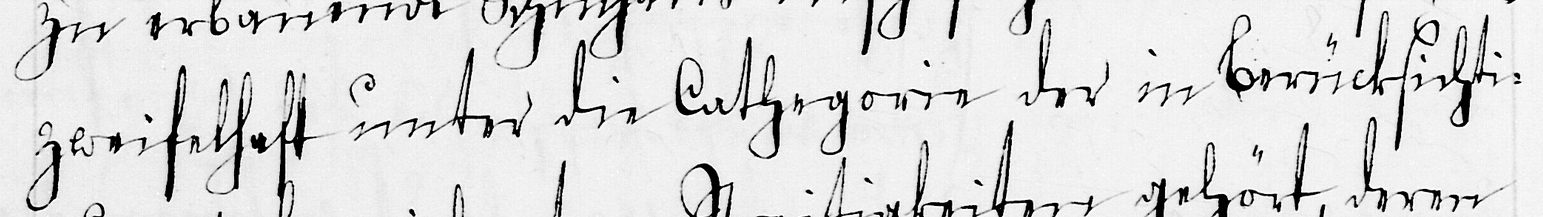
nzweifelhaft unter die Cathegorie der in Berücksichti¬
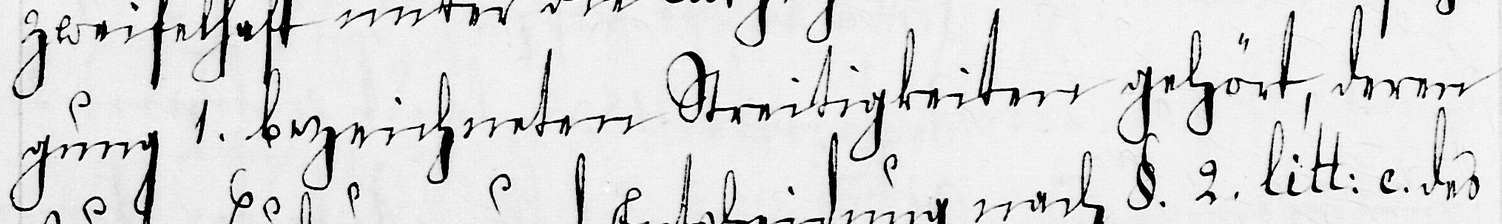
gung 1. bezeichneten Streitigkeiten gehört, deren
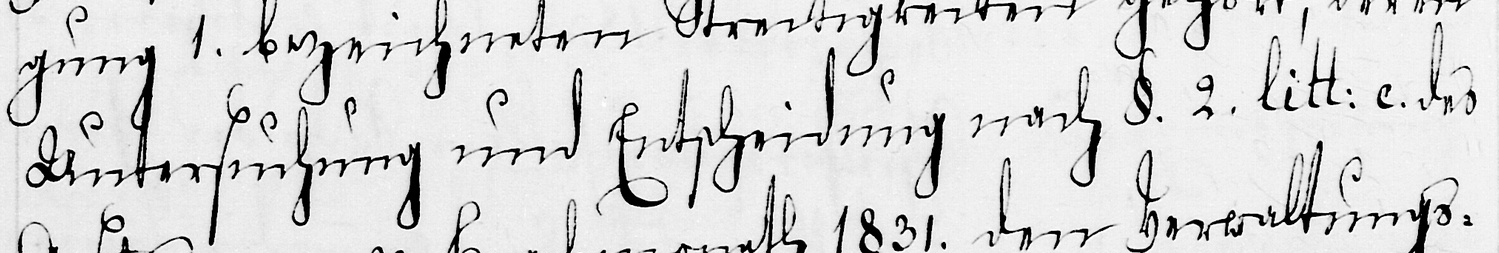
Untersuchung und Entscheidung nach §. 2. litt: c. des
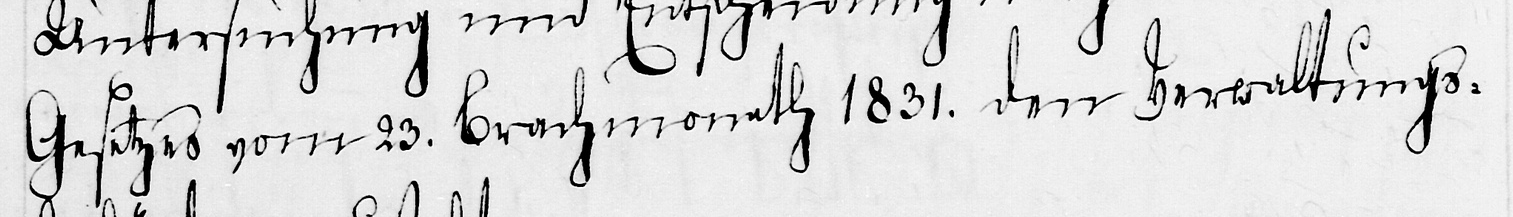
Gesetzes vom 23. Brachmonath 1831. den Verwaltungs¬
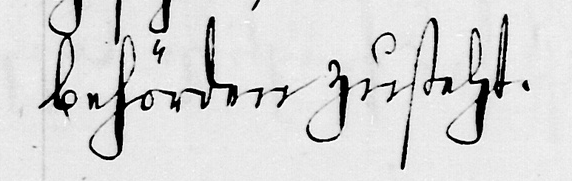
behörden zusteht.
